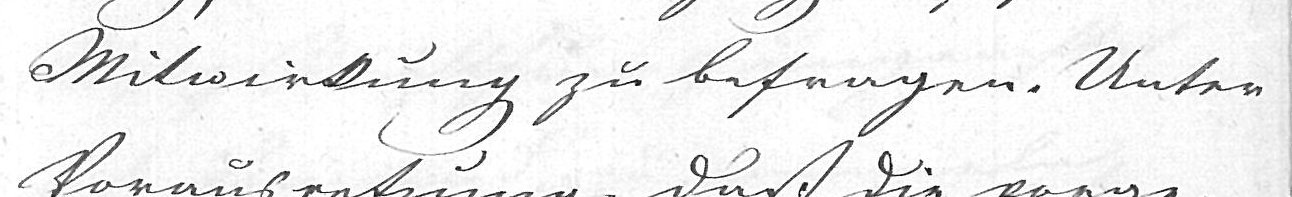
Mitwirkung zu befragen. Unter
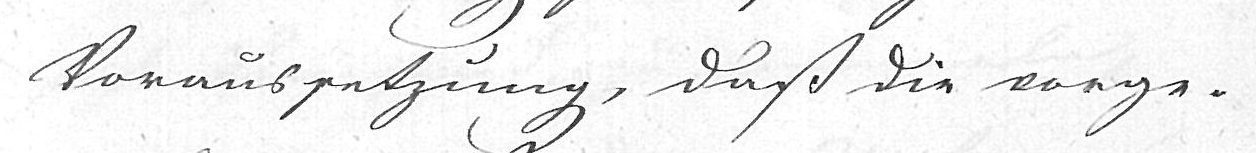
Voraussetzung, daß die vorge-
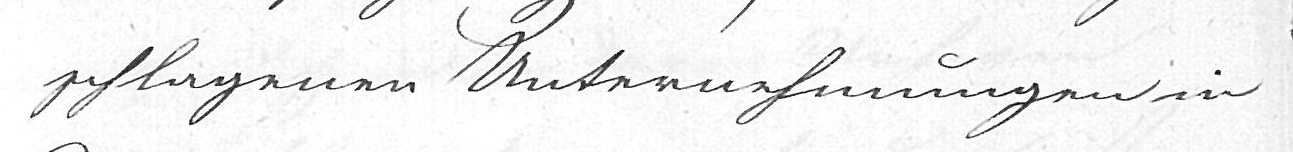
schlagenen Unternehmungen in
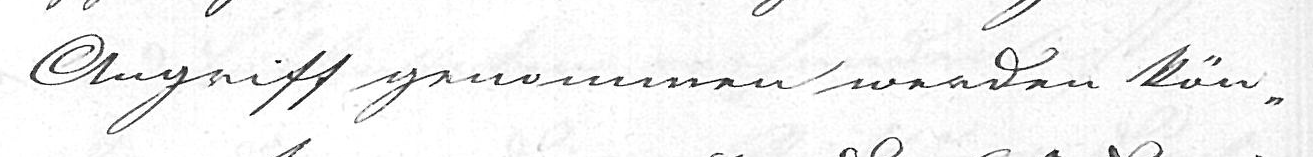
Angriff genommen werden kön-
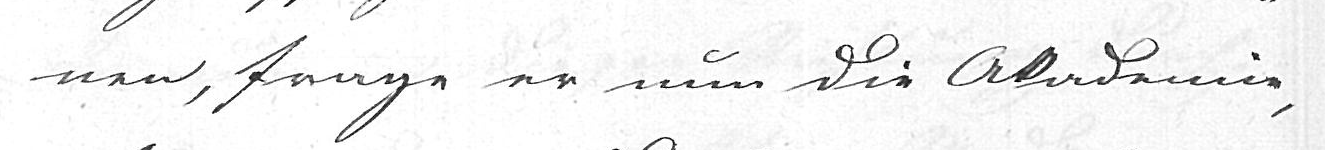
nen, frage er nun die Akademie,
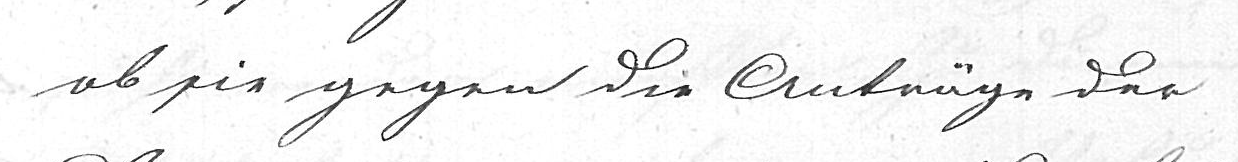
ob sie gegen die Anträge der
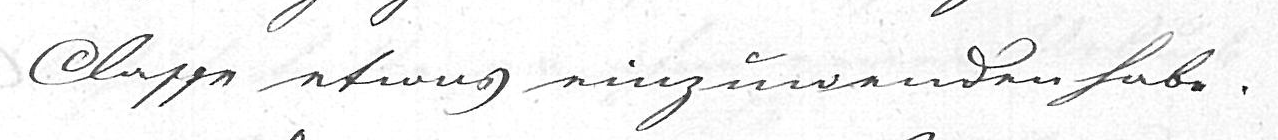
Classe etwas einzuwenden habe.
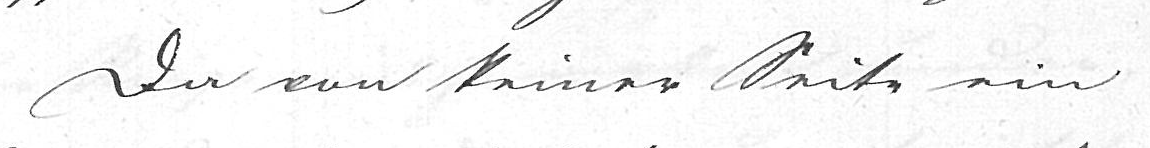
Da von keiner Seite ein
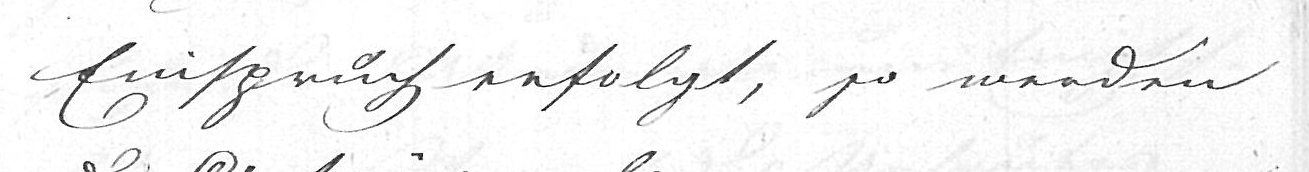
Einspruch erfolgt, so werden
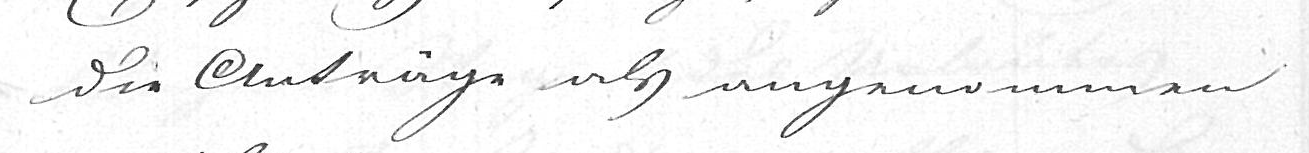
die Anträge als angenommen
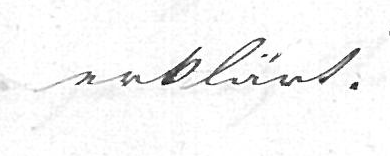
erklärt.
